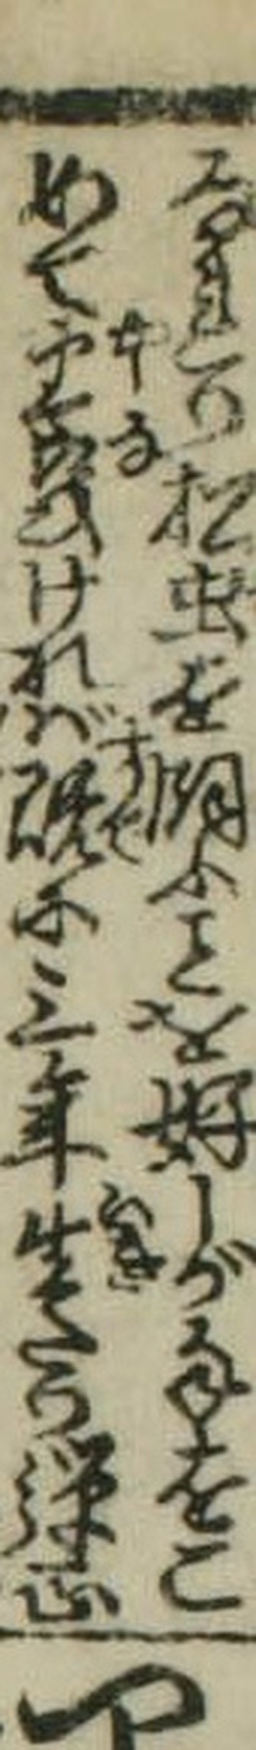めて養ひければ既に三年生たり弾正
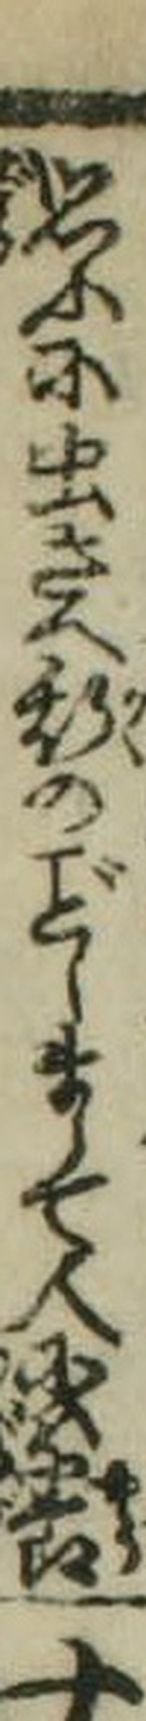思ふに虫さへ斯のごとしまして人には養
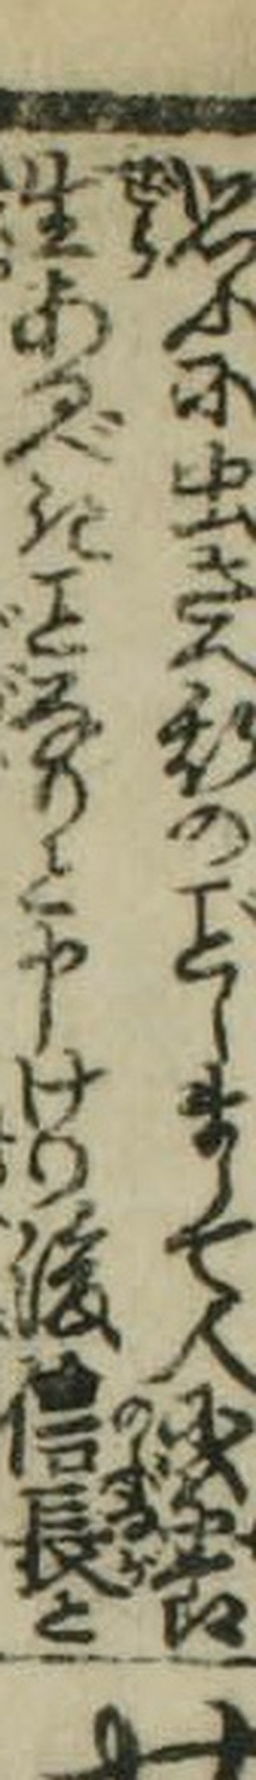生あるべきことなりと申けり後信長と
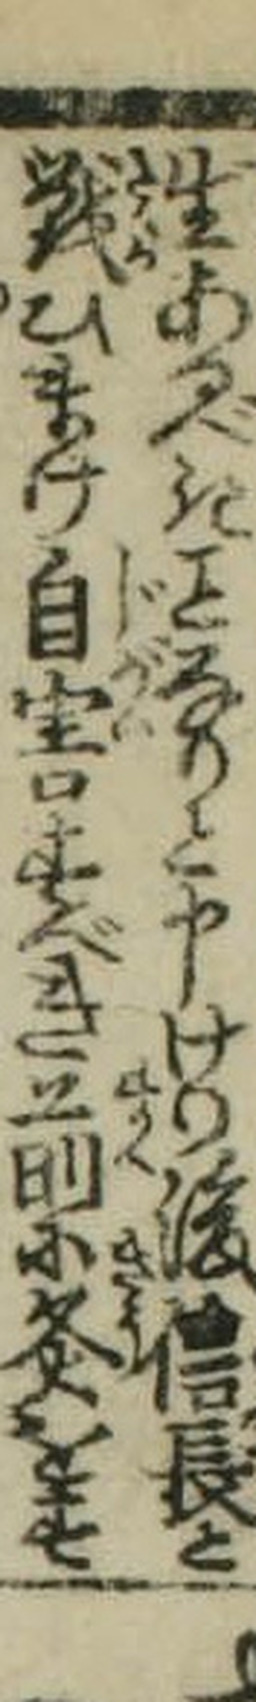戦ひまけ自害すべき前に灸をす
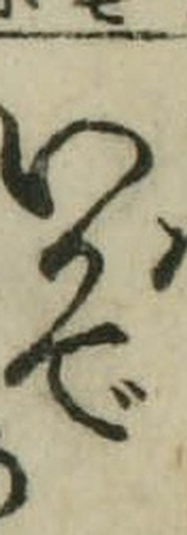いかで
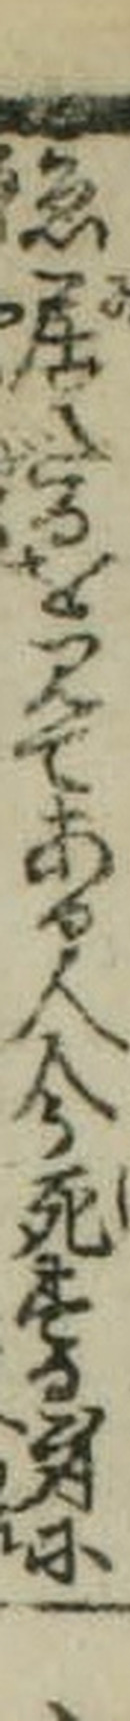ゑ居たるを見てある人今死する身に
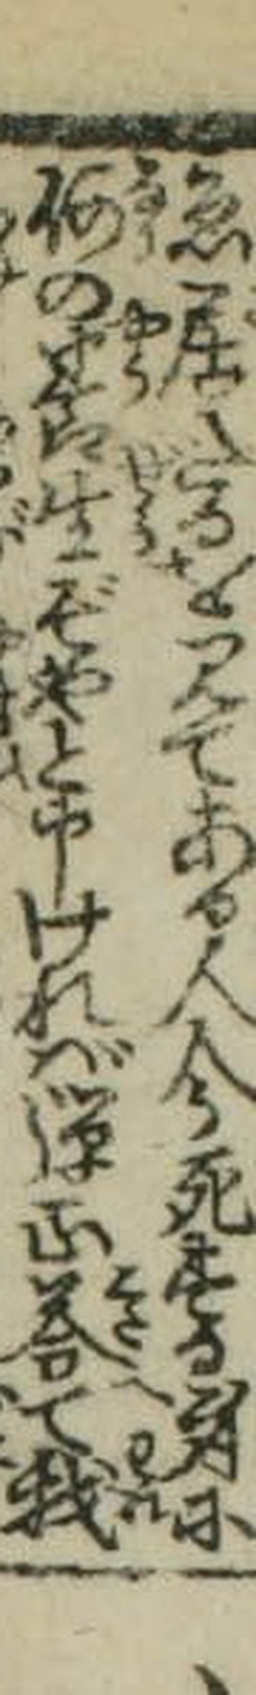何の養生ぞやと申ければ弾正答て我
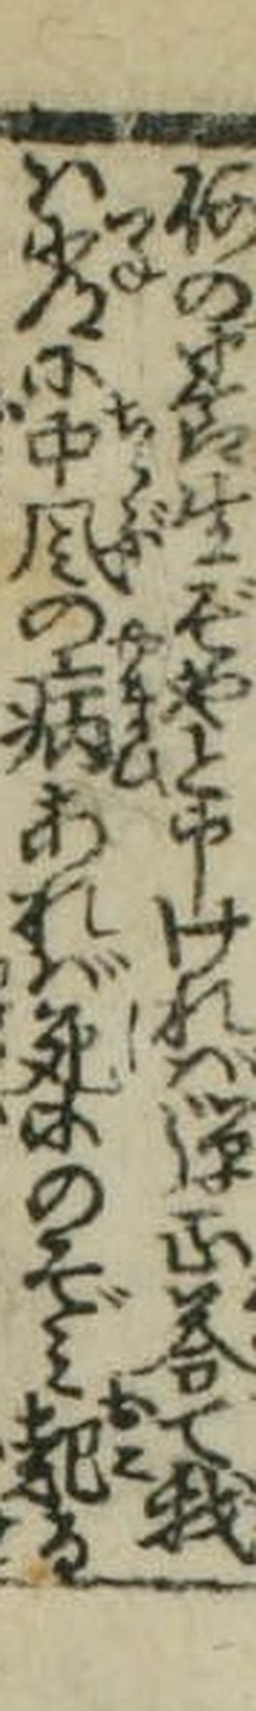は常に中風の病あれば死にのぞみ起る
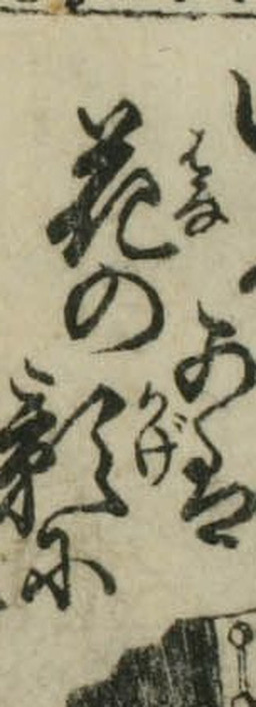花の影に
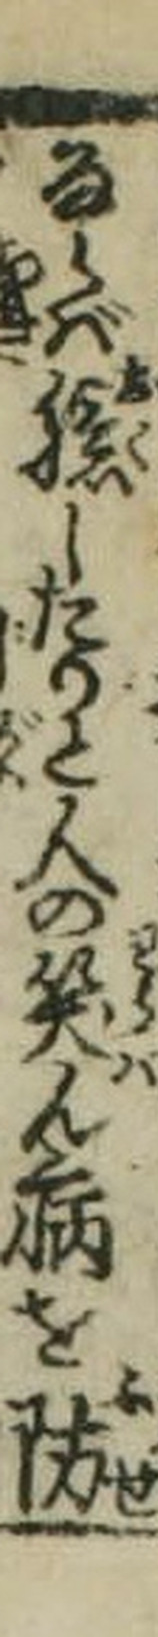ならば臆したりと人の笑ん病を防
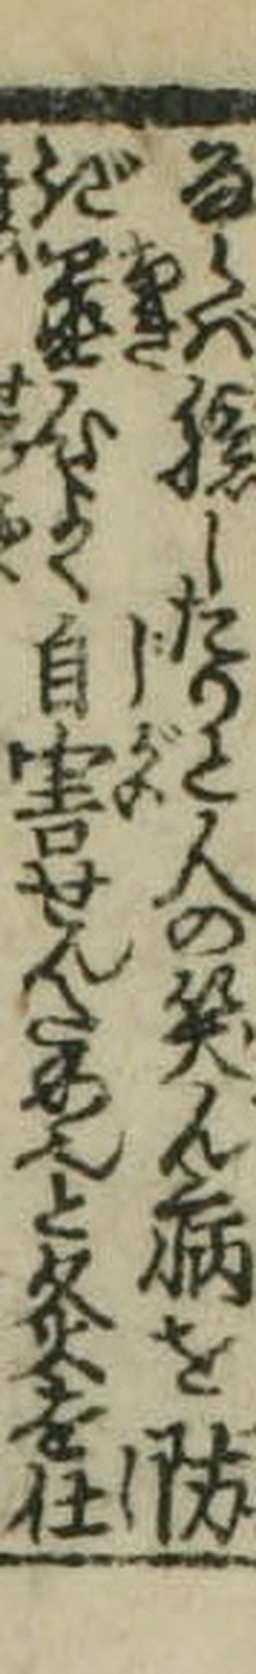ぎ置心よく自害せんため成と灸を仕
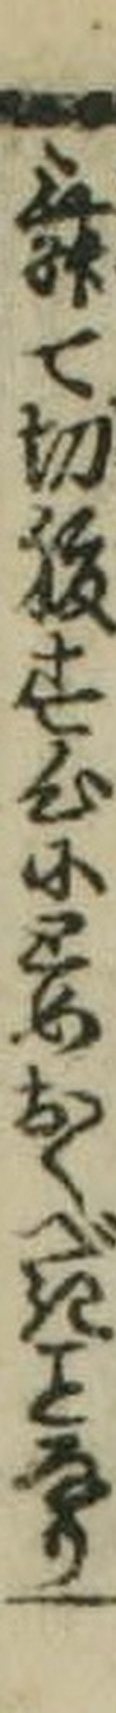舞て切腹す心にとめおくべきことなり
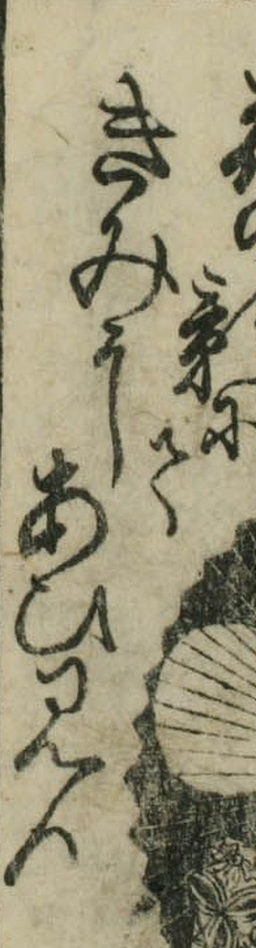きみにあひみん
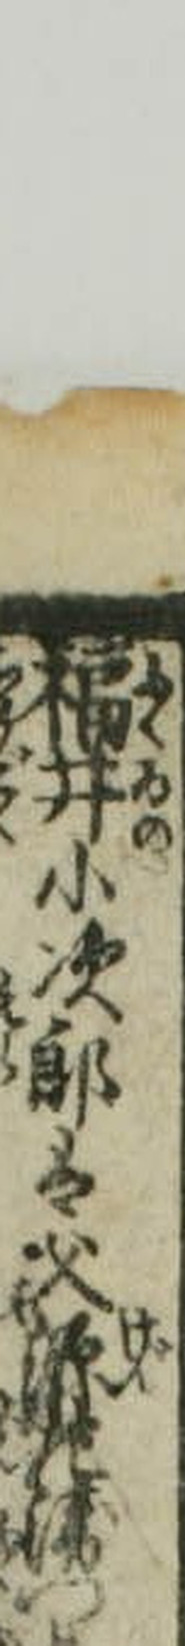福井小次郎政家
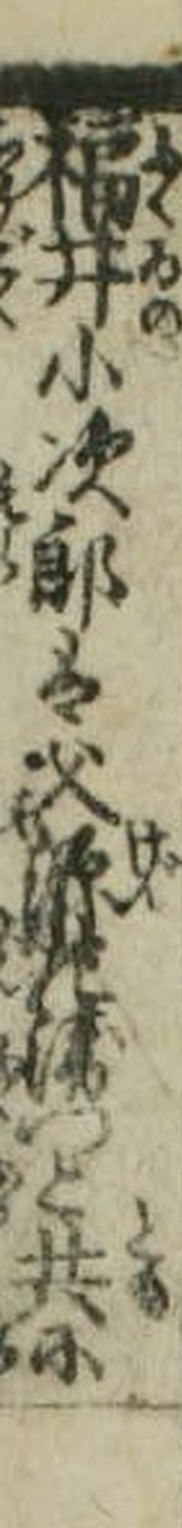福井小次郎は父源左衛門と共に
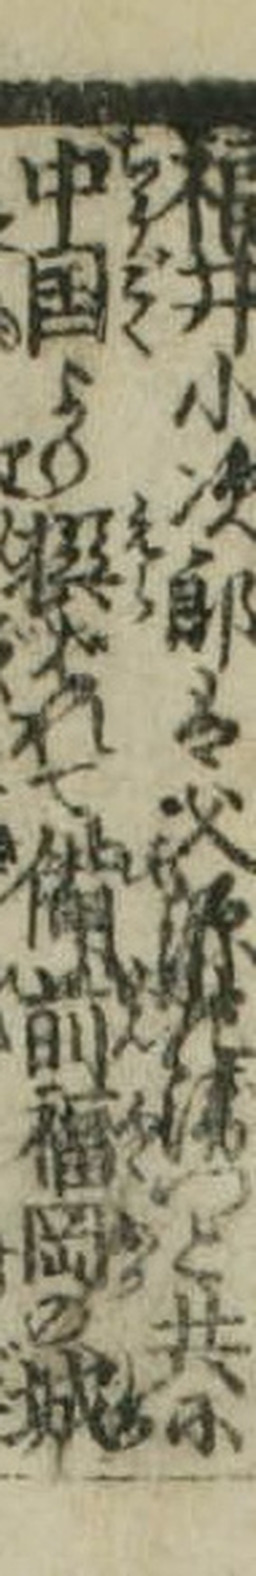中国より撰ばれて備前福岡の城
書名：續英雄百人一首
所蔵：東京学芸大学附属図書館
